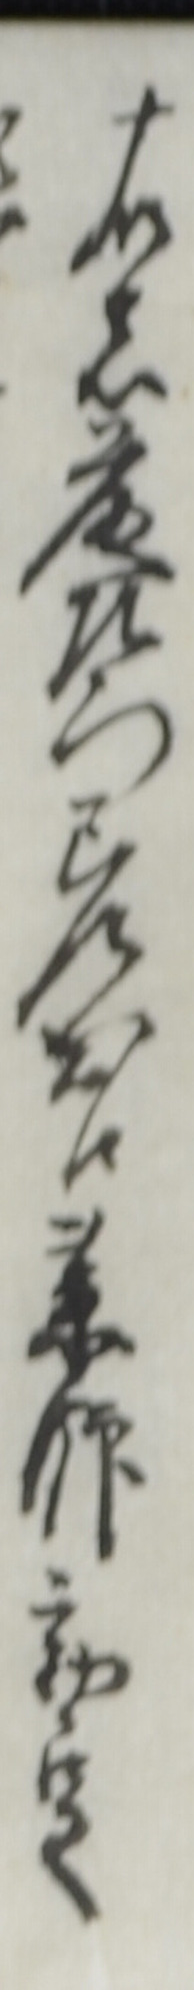右者藤左衛門差出候薬師勤定
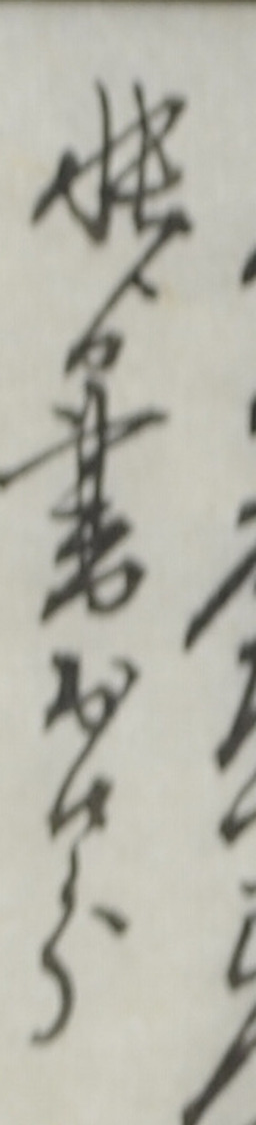帳ゟ書出候分
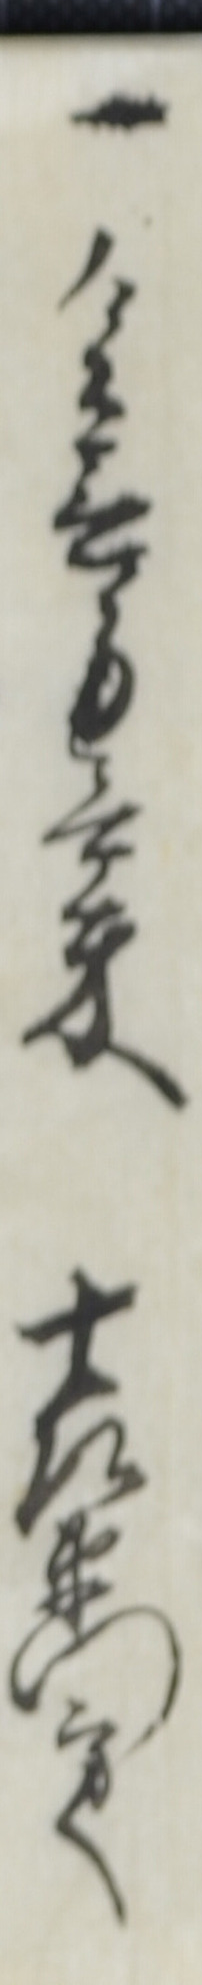一金壱分壱朱七左衛門方へ
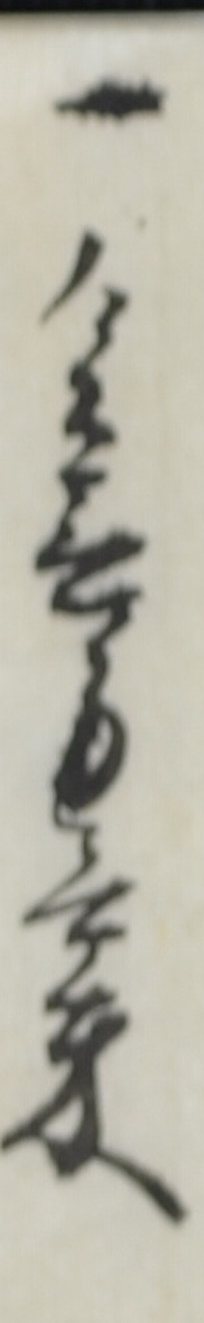一金壱分大工
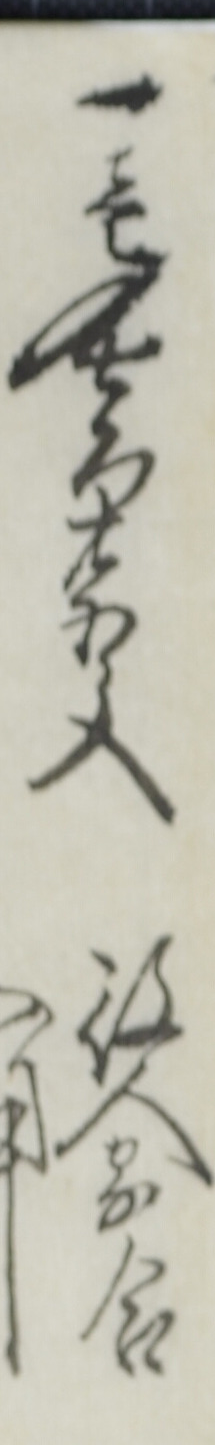一壱〆七百廿五文役人寄合
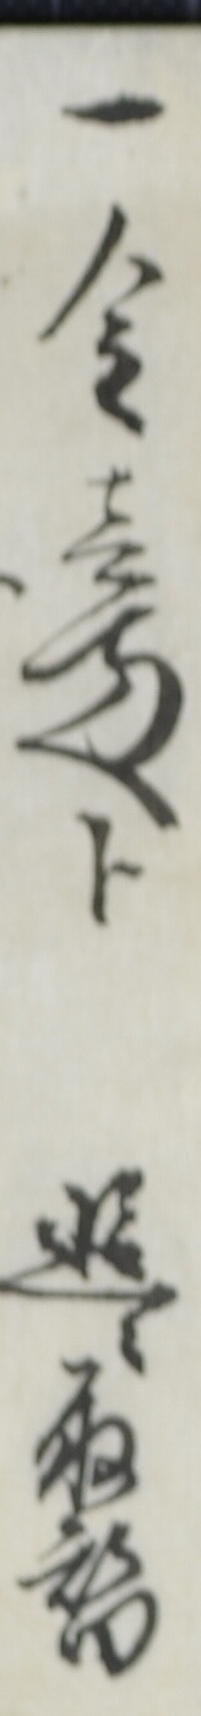一金壱両ト追々取替
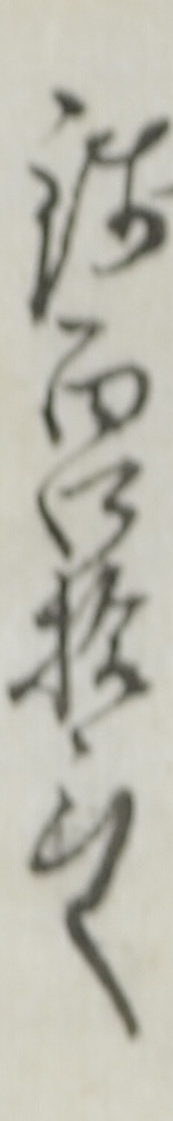銭百四拾三文
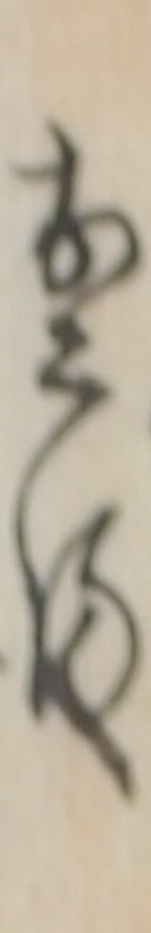おこま
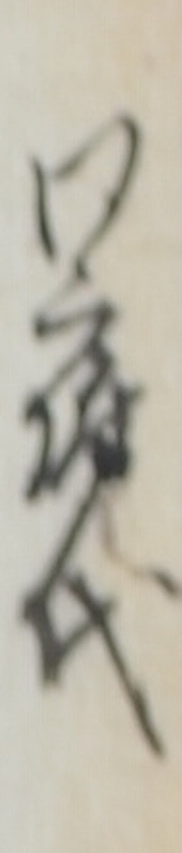同雇代
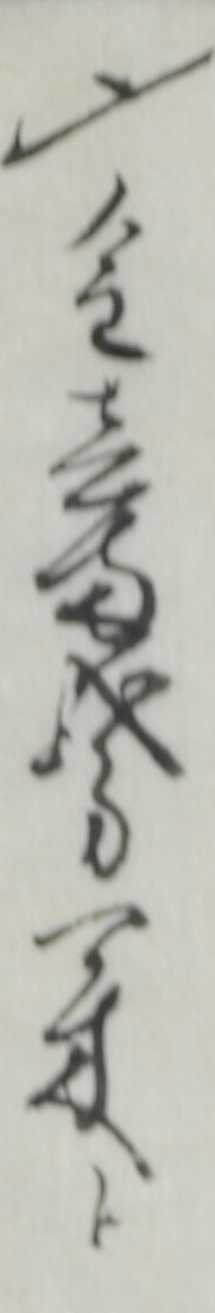〆金壱両弐分一朱ト
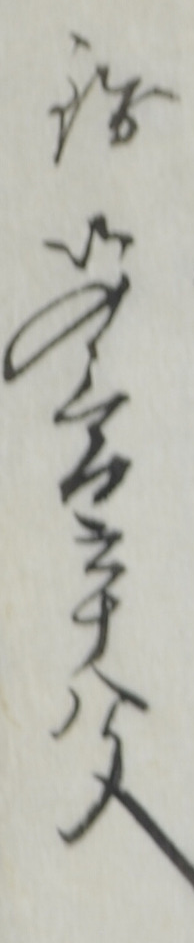銭弐〆三百六十八文

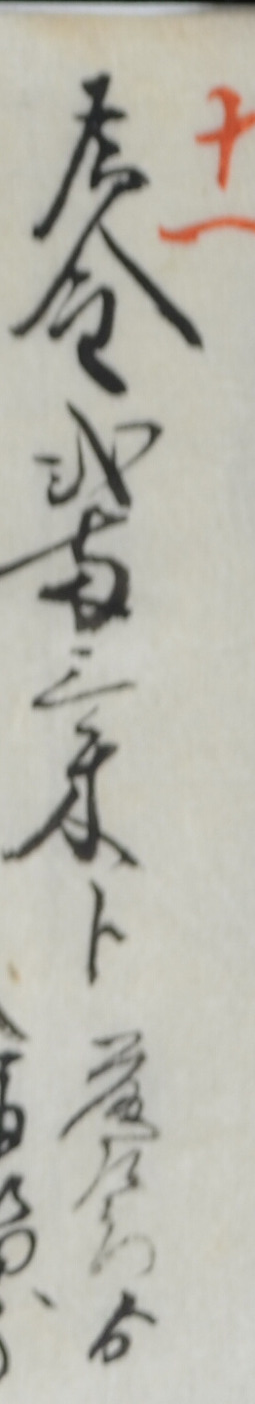為金弐両三朱ト藤左衛門ゟ
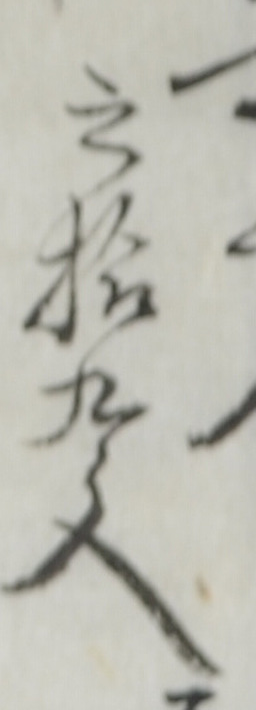六拾九文
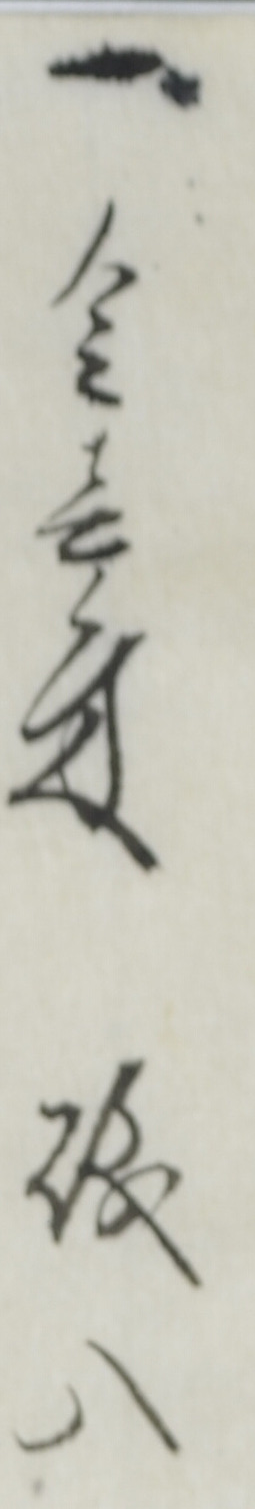一金壱朱儀八
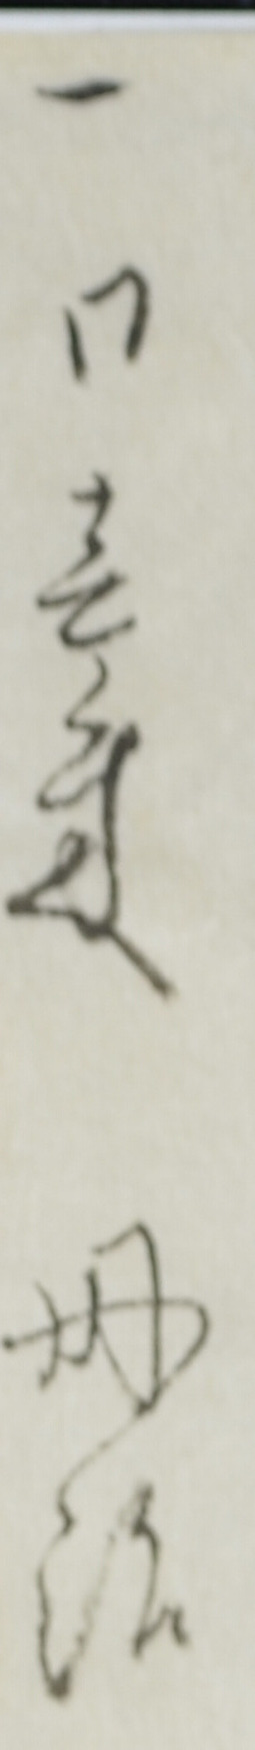一同壱朱丹治
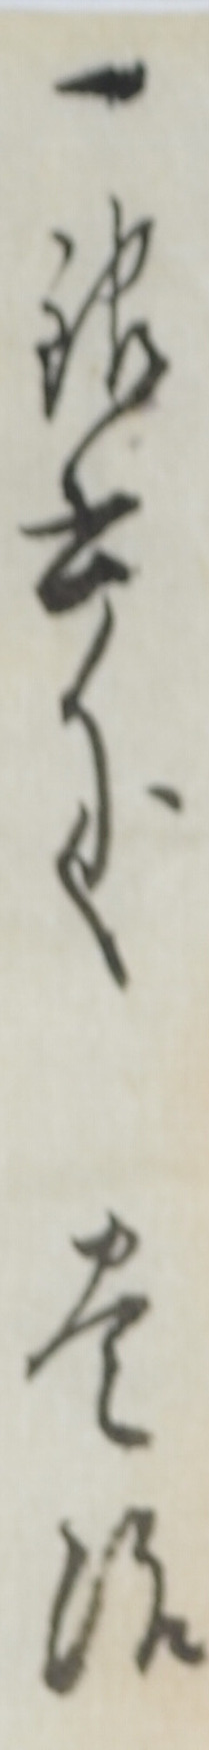一銀六匁豊治
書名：（金銭勘定抜書）
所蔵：伊那市立高遠町図書館・合同会社AMANE
